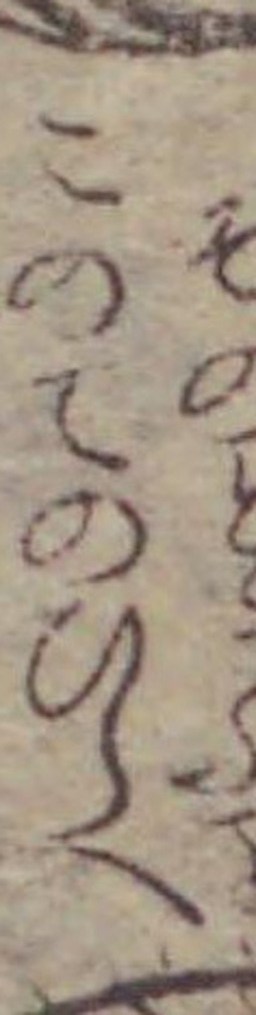このてのひらへ
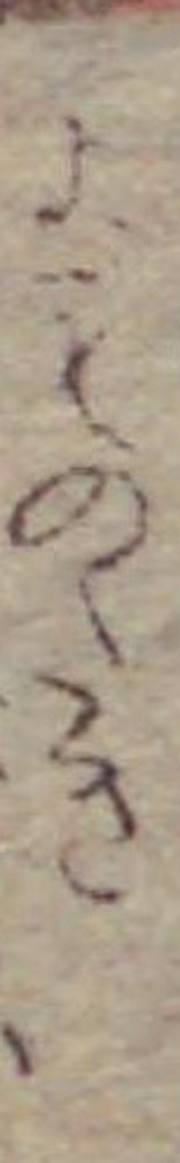よものたき
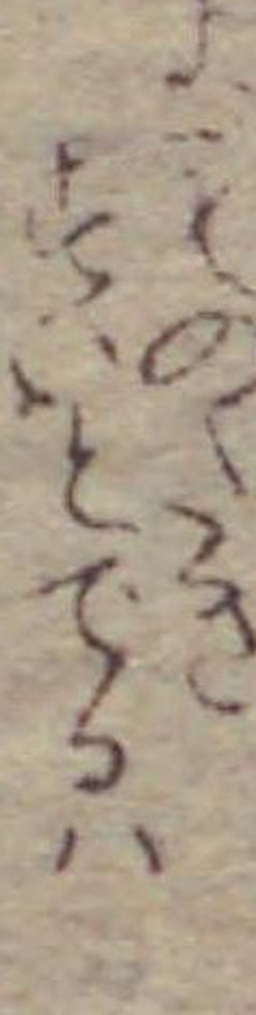すいとでるは
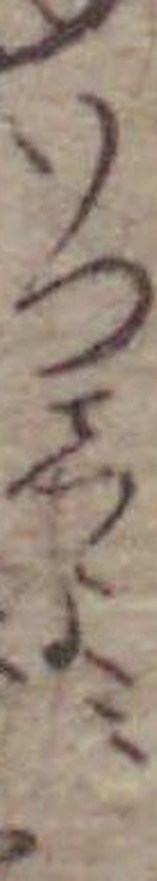いつしよに
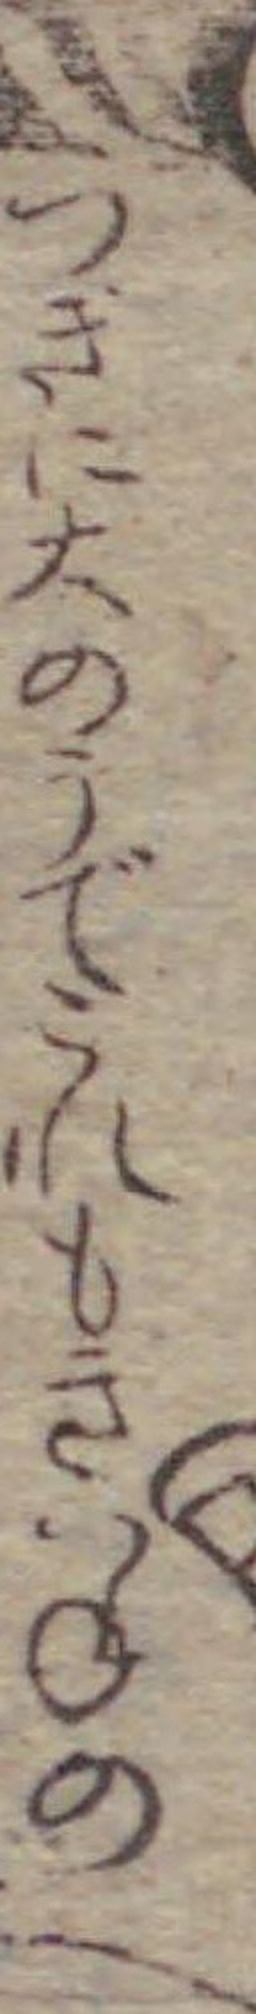つぎに大のうでこれもきつねの
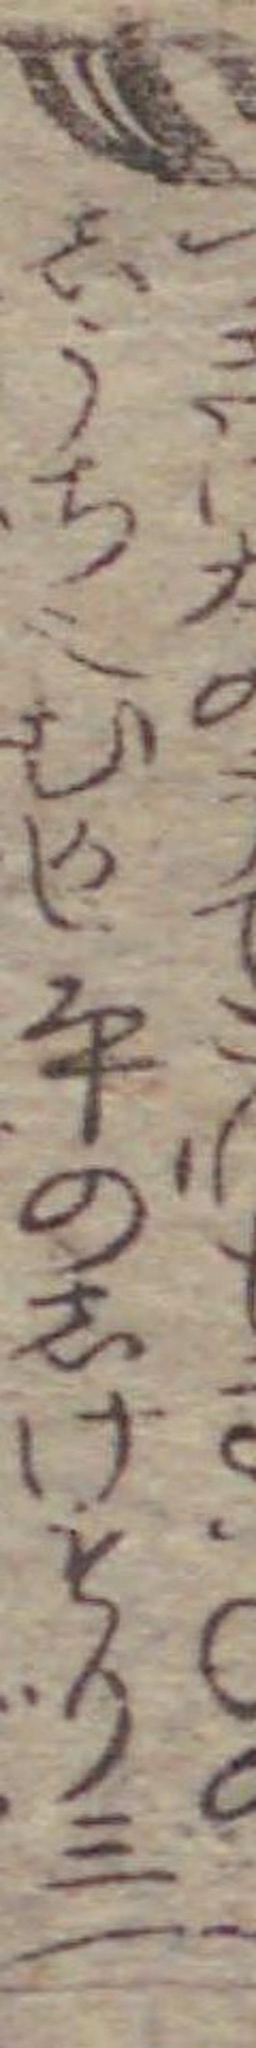しうち也むかし平のしけもり三
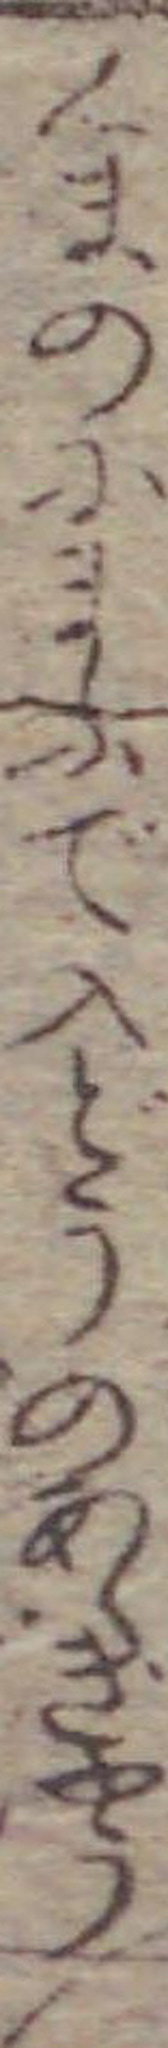くまのにまふで入どうのあくぎやう
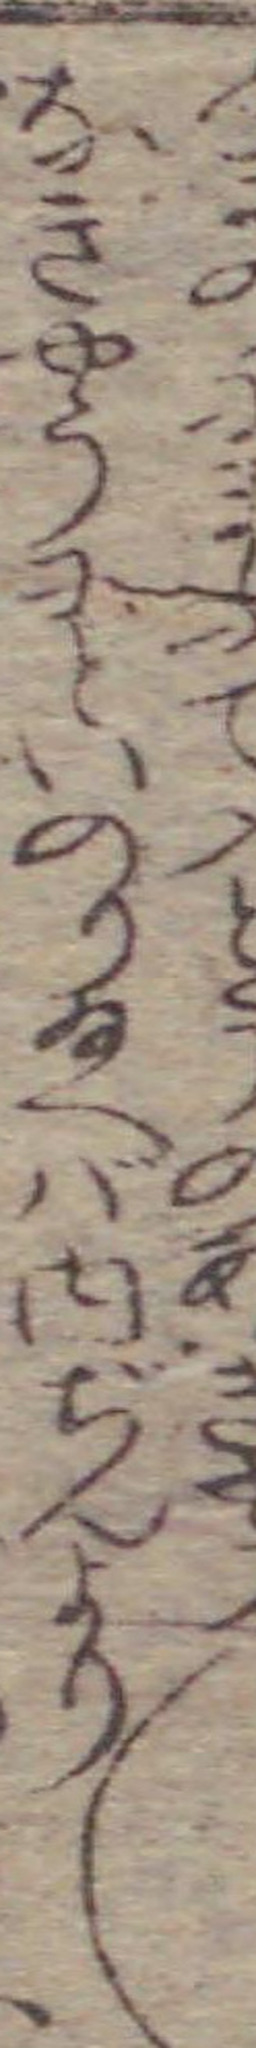なきやうにといのり給へば内ぢんより
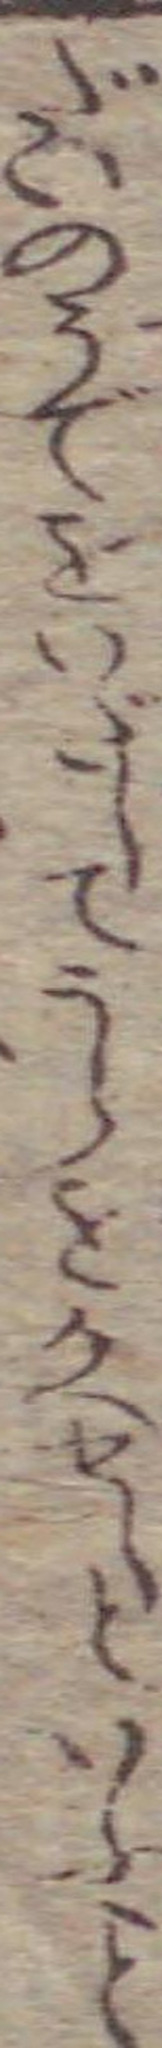だいのうでをいだしてかしらをかへせといふこと
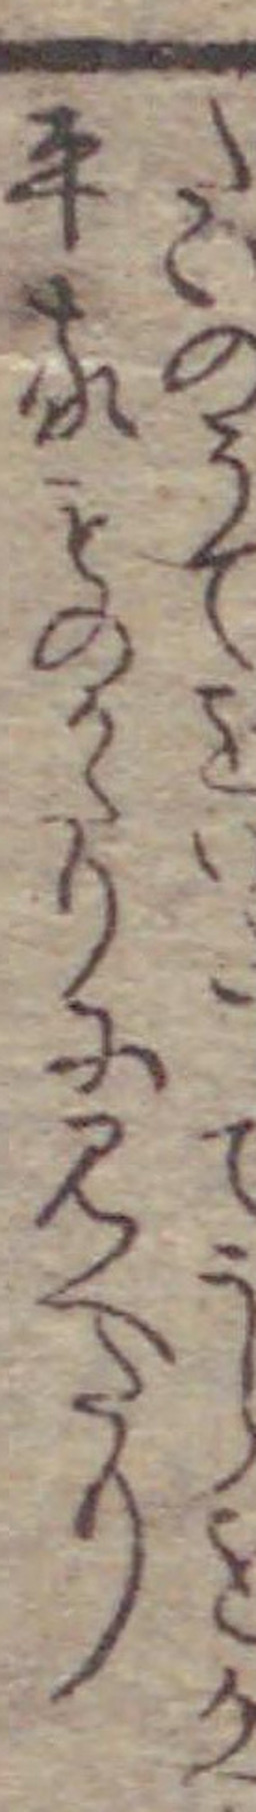平家ものかたりに見へたり

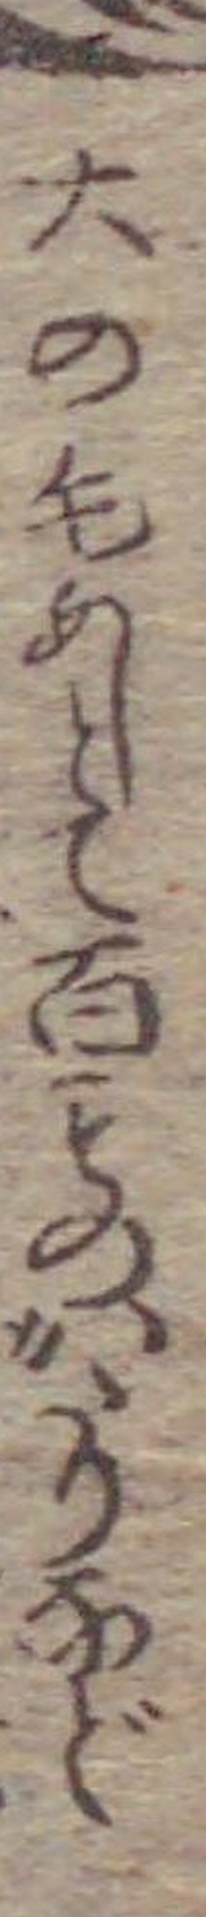大の毛あしとて百ものかたりなど
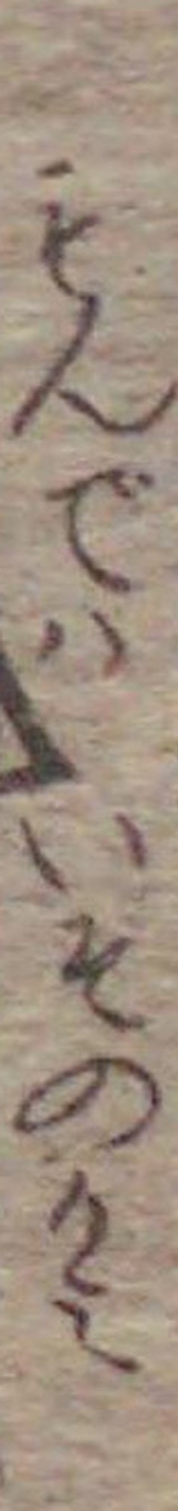もんではいそのかみ
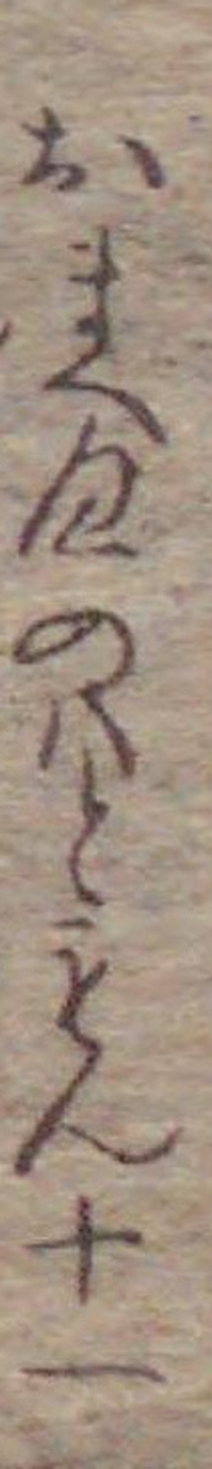おまへ様のはともん十一
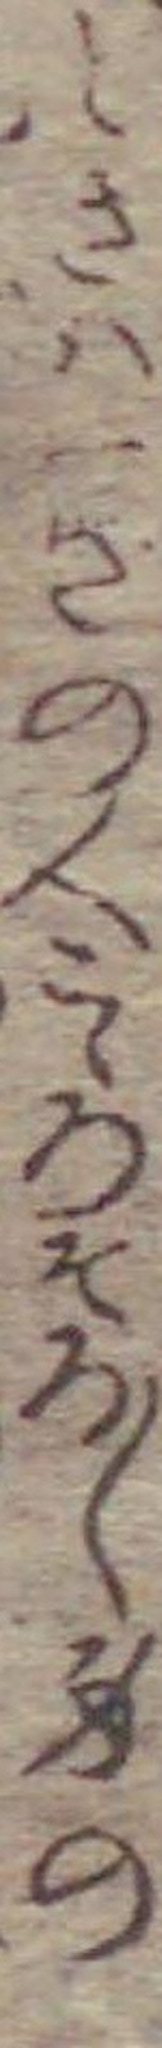ときは一ざの人こゝろそろ〳〵身の
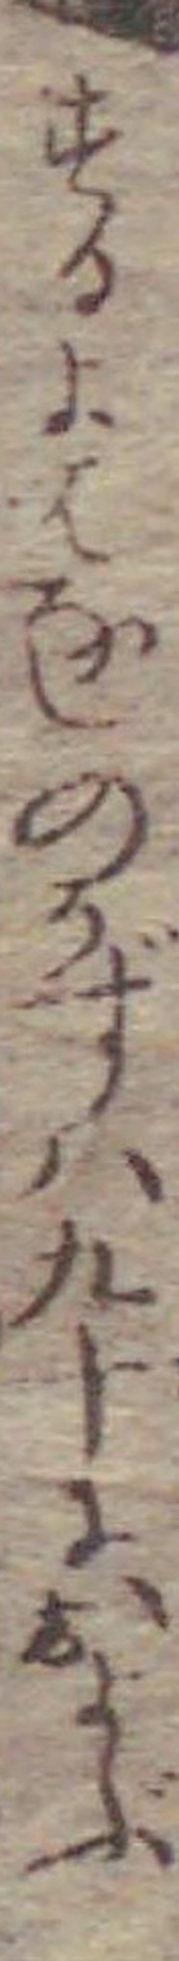するよはなしのかずは九十におよぶ
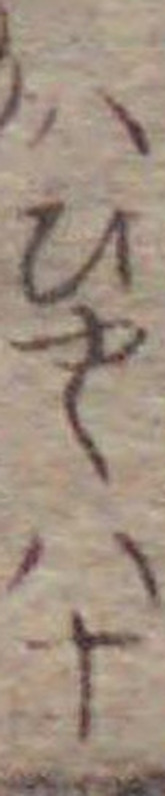八ひやく八十
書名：妖怪仕内評判記 : 2巻
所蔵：国立国会図書館 National Diet Library, JAPAN
